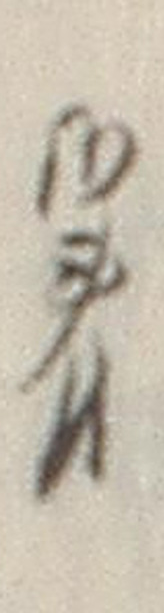御書付
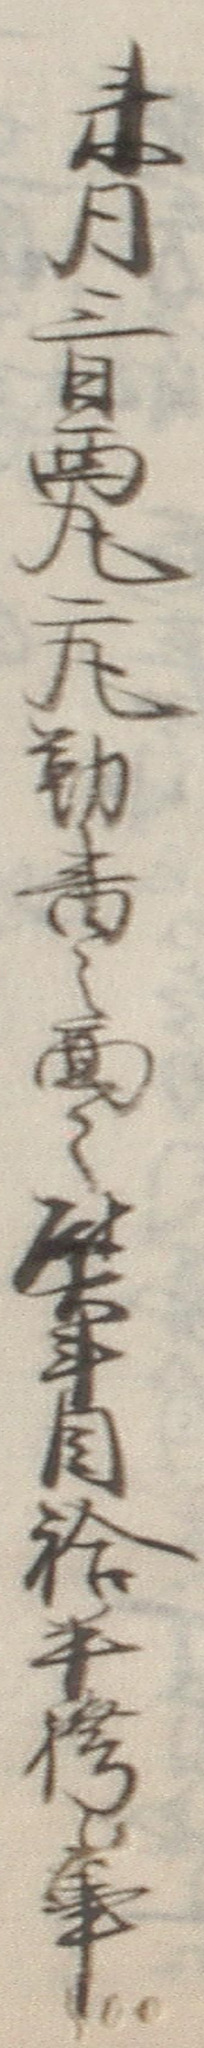来月三日西丸二丸勤番の面々熨斗目袷半袴候事
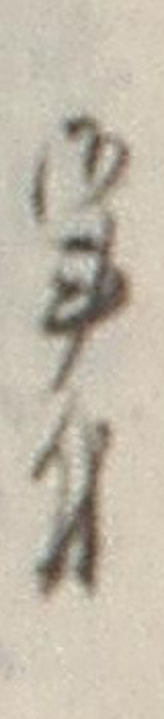御書付
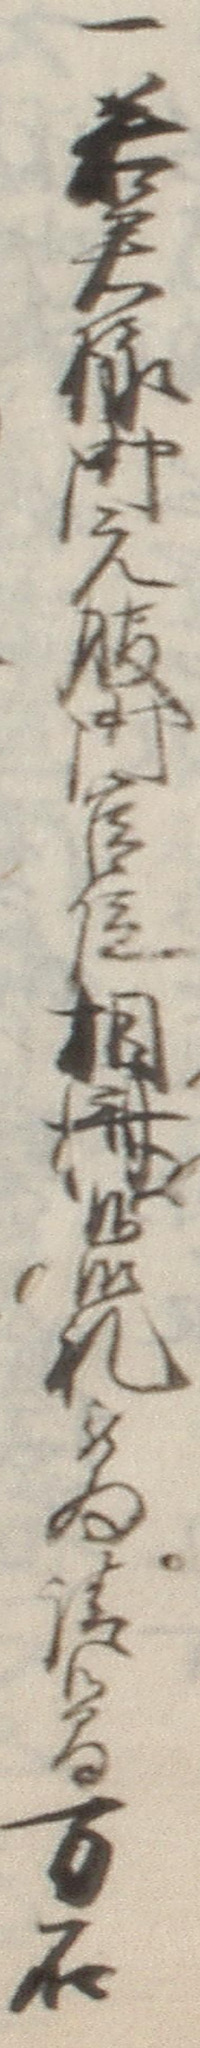一若君様御元服御官位相済候御礼被為請候間万石
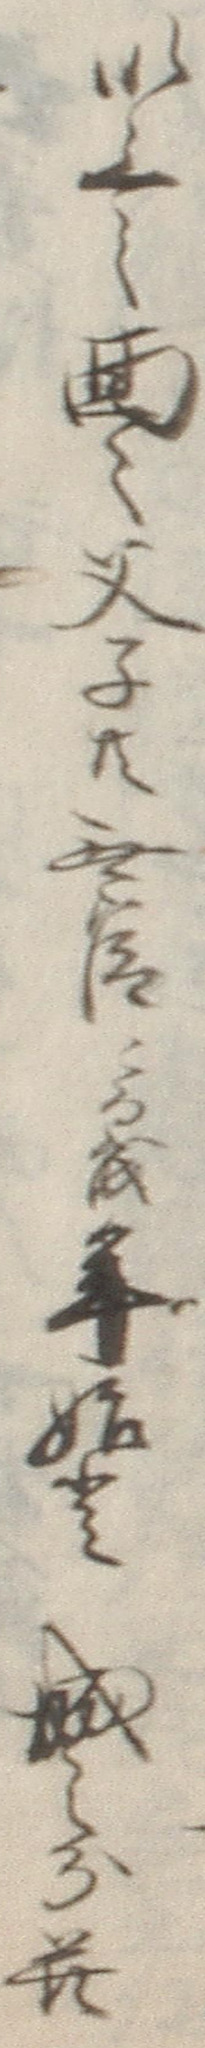以上の面々父子共無官ニ而も年始登城の分并
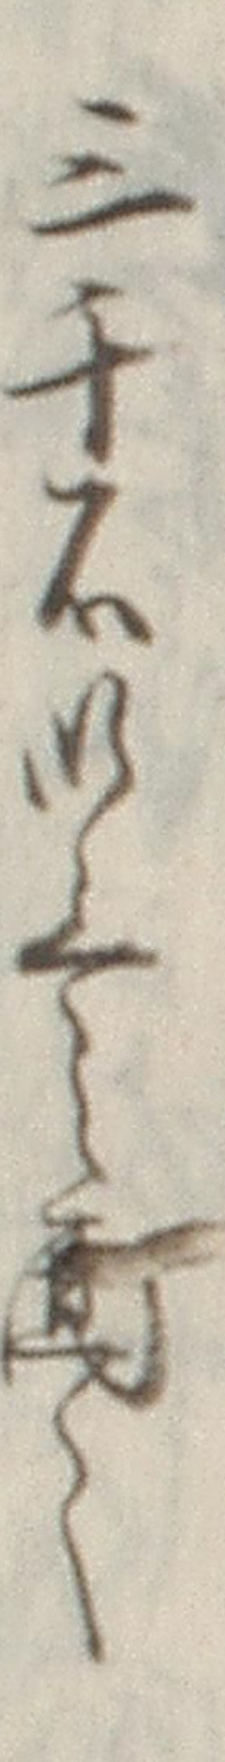三千石以上の面々
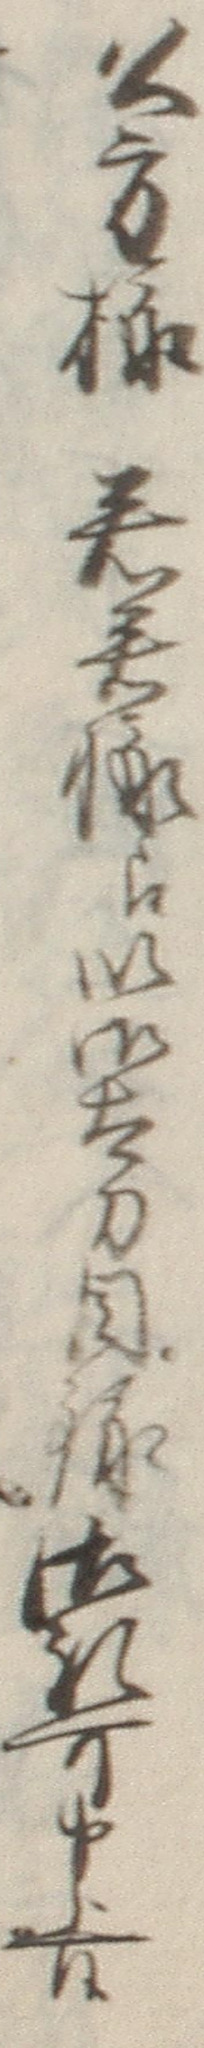公方様若君様え以御太刀目録御礼可申上候
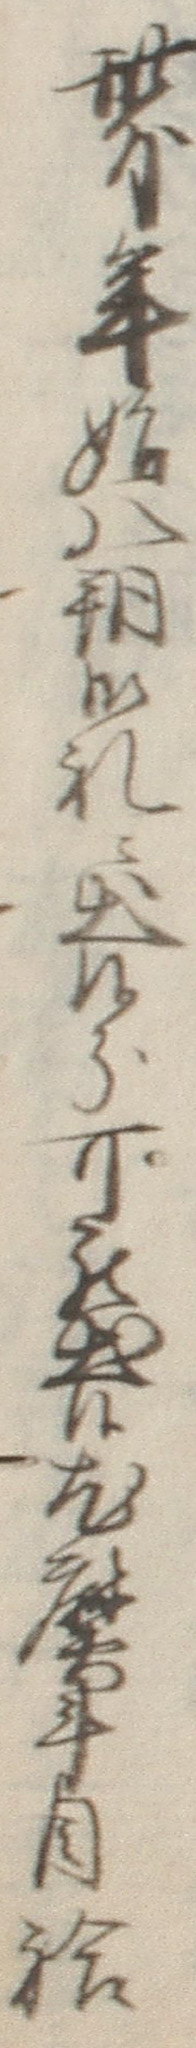此外年始八朔御礼ニ出候分可罷出候尤熨斗目袷

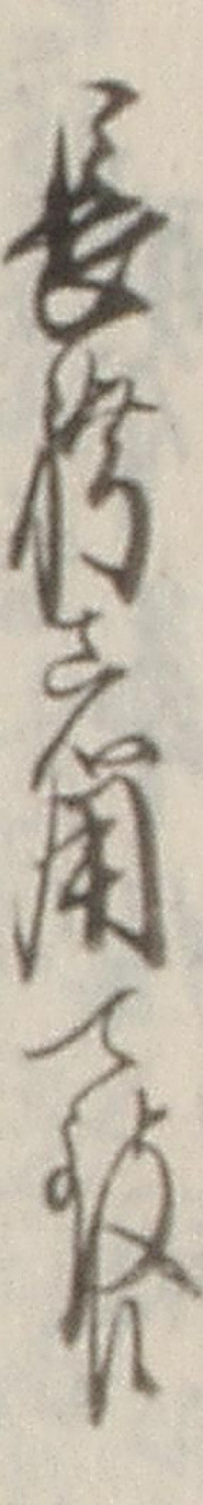長袴着用可致候
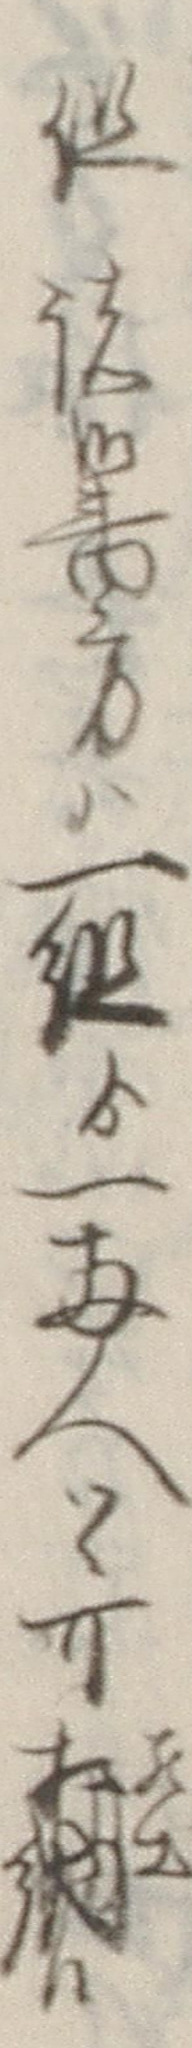但諸御番方ハ一組ゟ一両人ツヽ可相罷出候
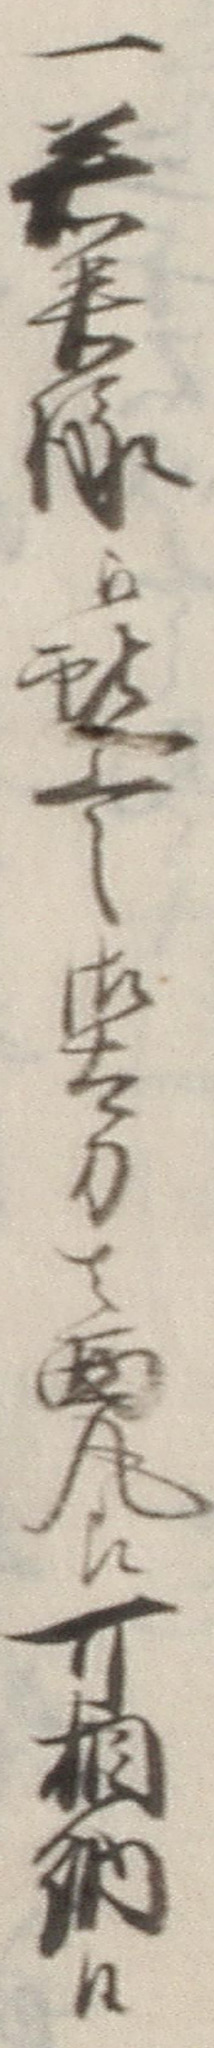一若君様え献上之御太刀は西丸え可相納候
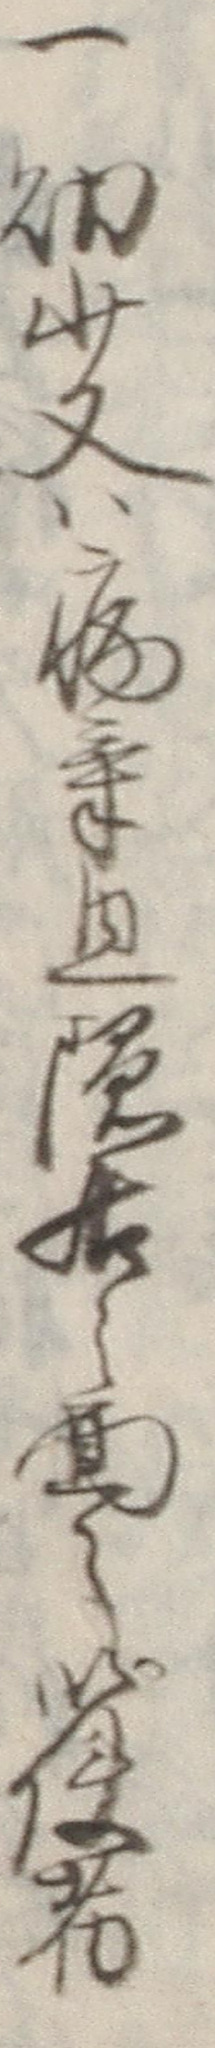一幼少又ハ病気且隠居の面々御使者
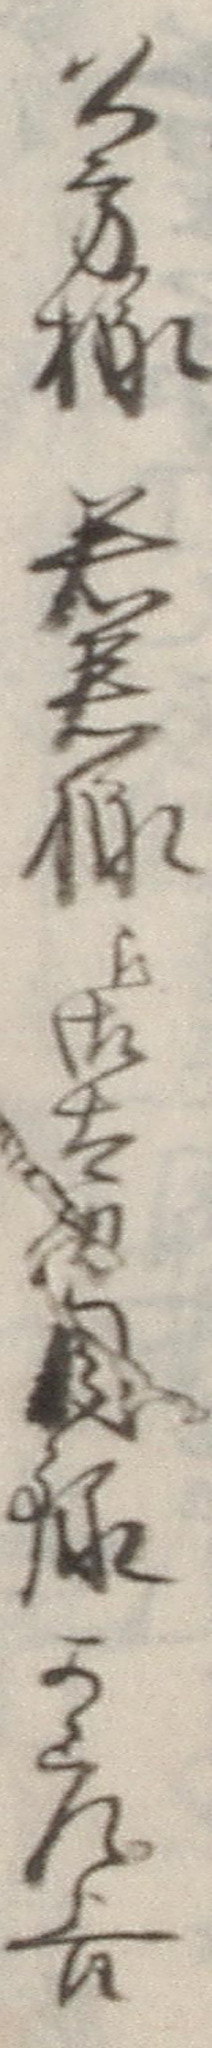公方様若君様え御太刀目録可差上候
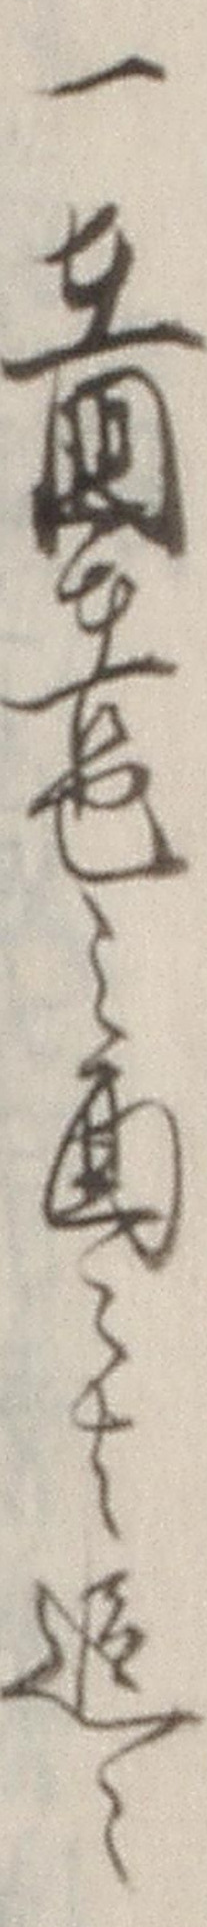一在国在邑之面々ニは追々
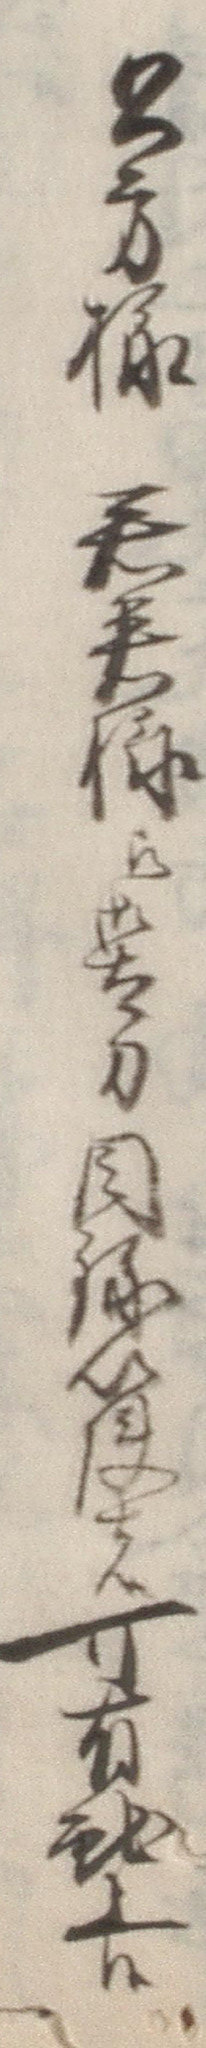公方様若君様え御太刀目録以使者可有献上候
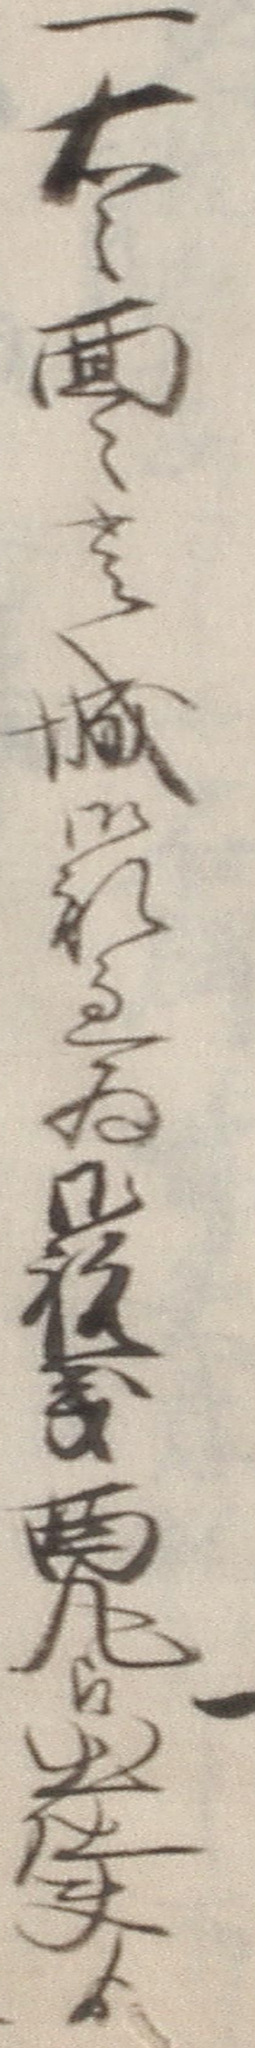一右の面々登城御礼過為御祝義西丸え出仕夫ゟ
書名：[諸国災害記録]
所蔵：東京大学地震研究所図書室 Earthquake Research Institute Library, The University of Tokyo, JAPAN
